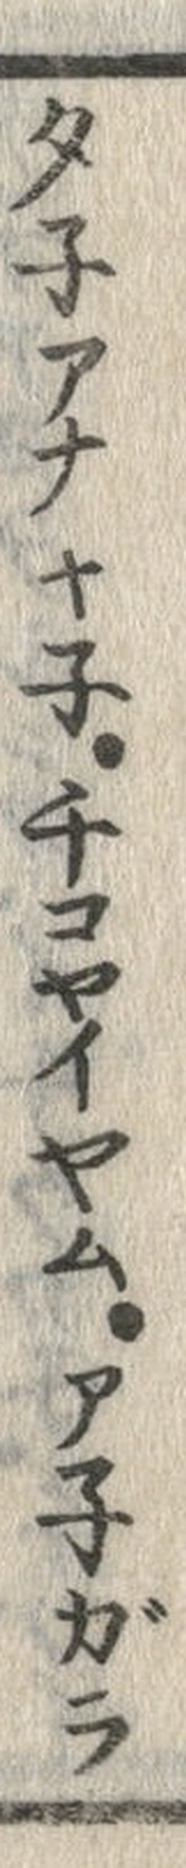タネアナキネ。チコヤイヤム。アネガラ
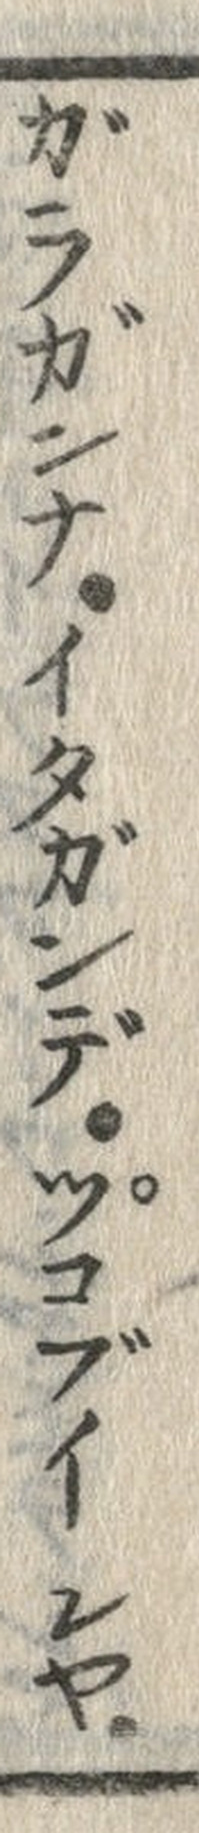ガラガンナ。イタガンデ。ツ゚コブイシヤ。
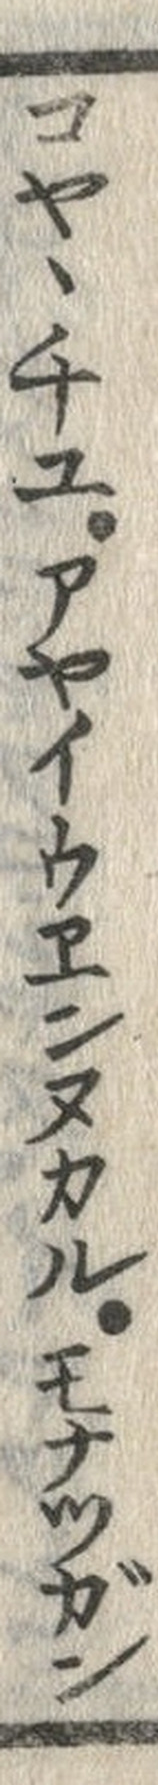コヤヽチユ。アヤイウヱンヌカル。モナツガン
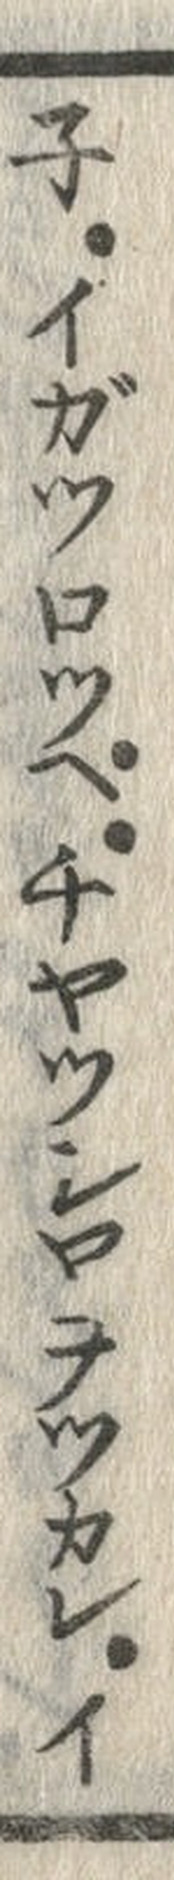ネ。イガツロツペ。チヤツシヤヲツカレ。イ
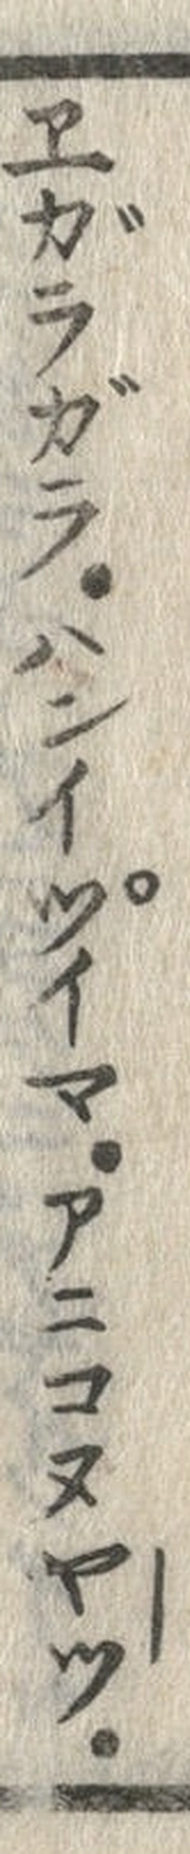ヱガラガラ。ハンイツ゚イマ。アニコヌヤツ。

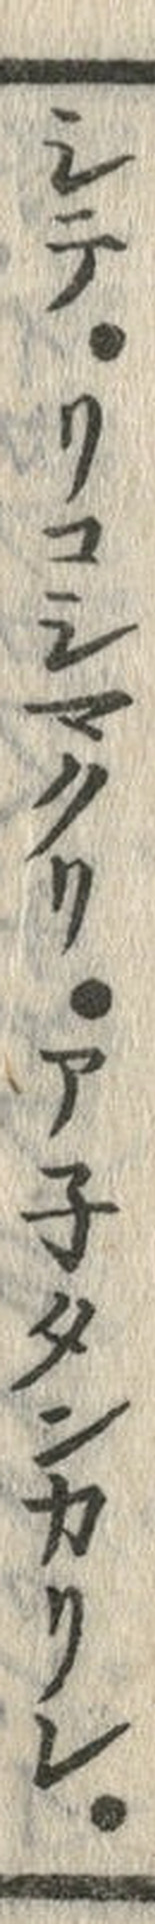シテ。リコシマクリ。アネタンカリレ。
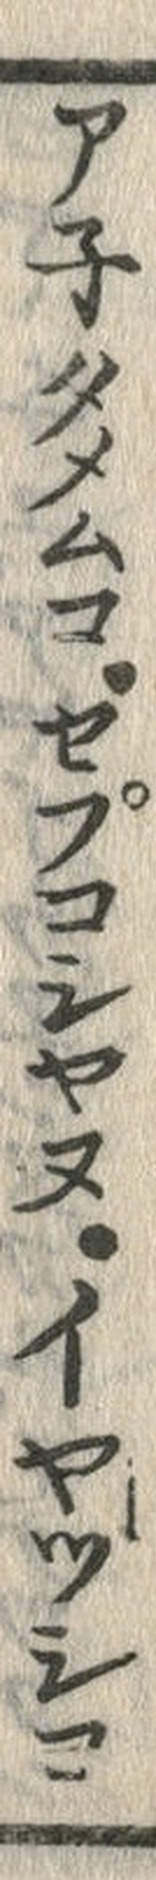アネタメムコ。セプコシヤヌ。イヤツシコ
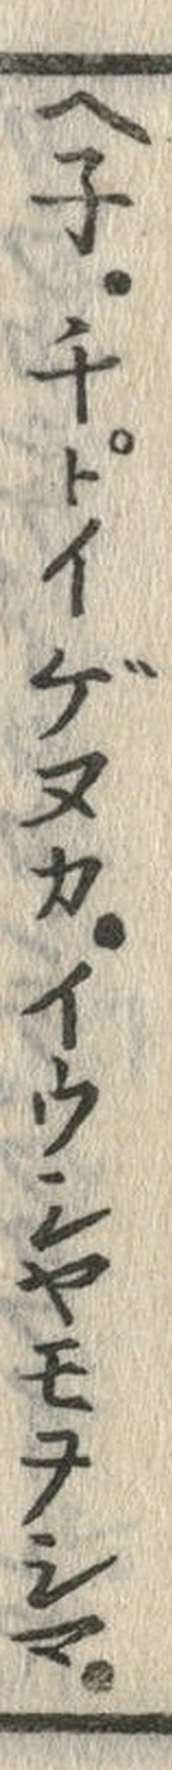ヘネ。チト゚イゲヌカ。イウシヤモヲシマ。
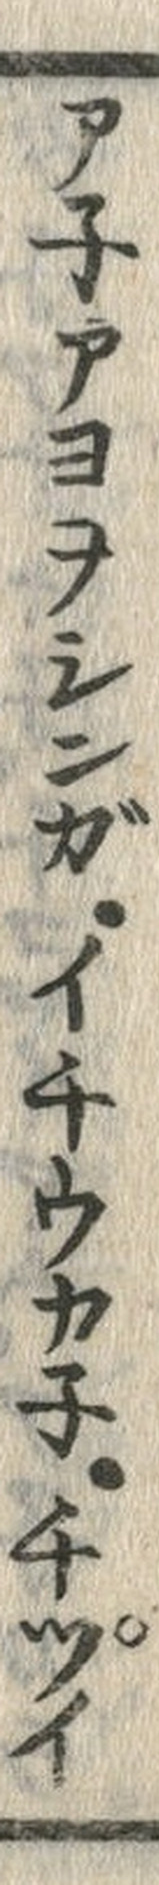アネアヨヲシンガ。イチウカネ。チツ゚イ
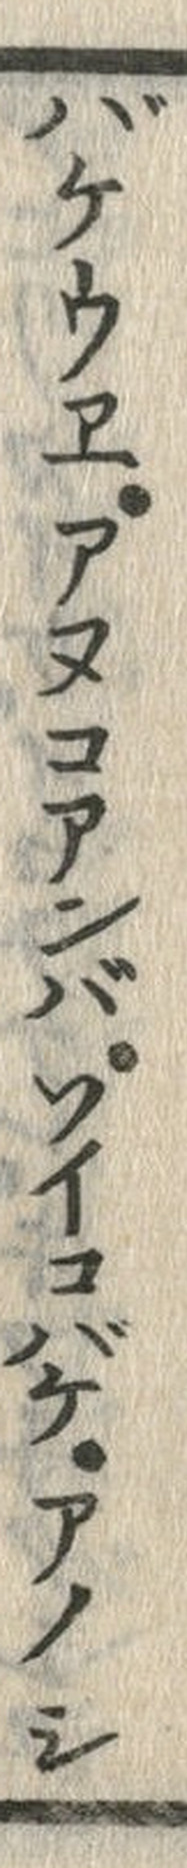バケウヱ。アヌコアンバ。ソイコバケ。アノシ
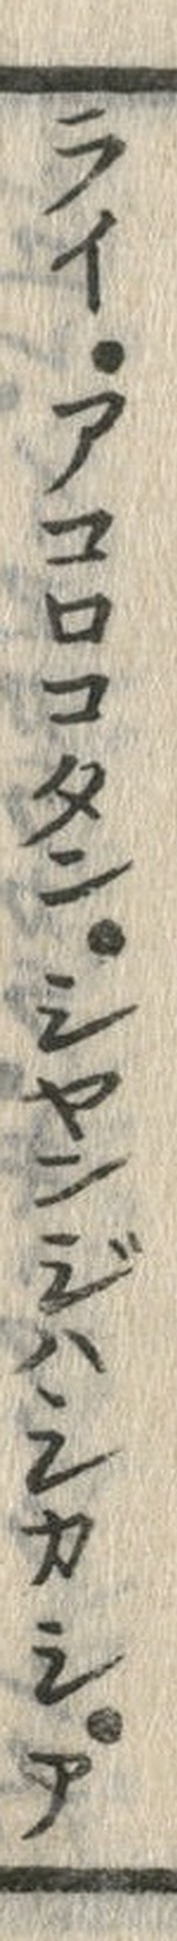ライ。アコロコタン。シヤンジハシカシ。ア
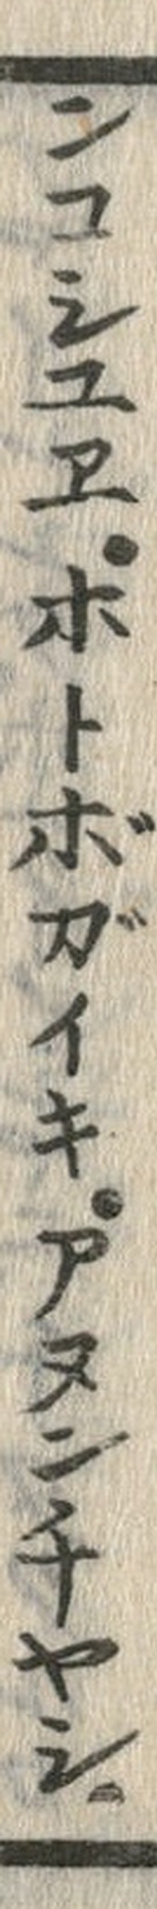ンコシユヱ。ホトボガイキ。アヌンチヤシ。

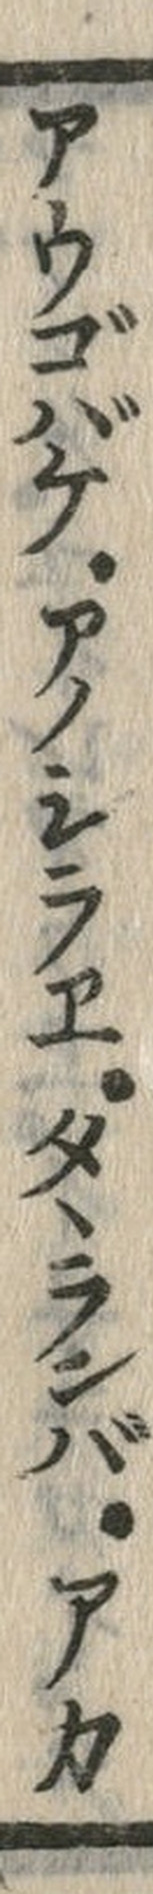アウゴバケ。アノシラヱ。タヽランバ。アカ
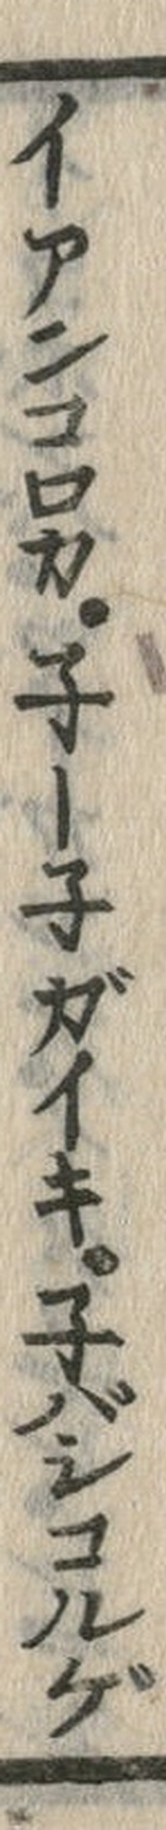イアンコロカ。ネーネガイキ。ネバシコルゲ
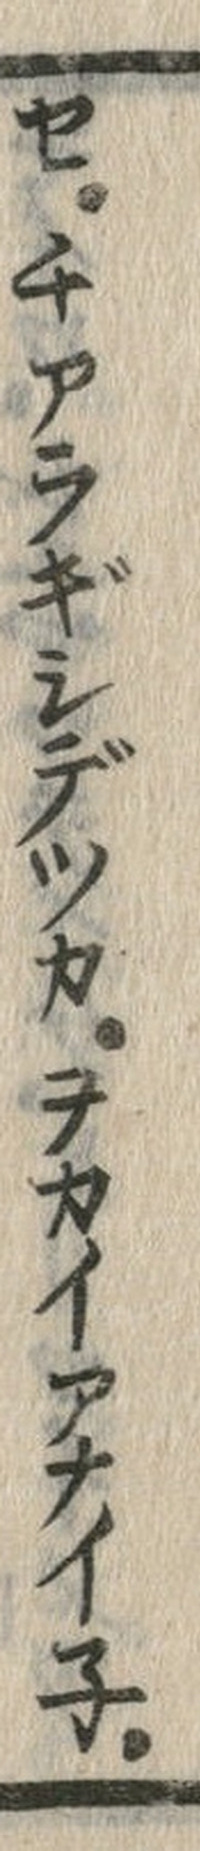セ。チアラギシデツカ。ヲカイアナイネ。
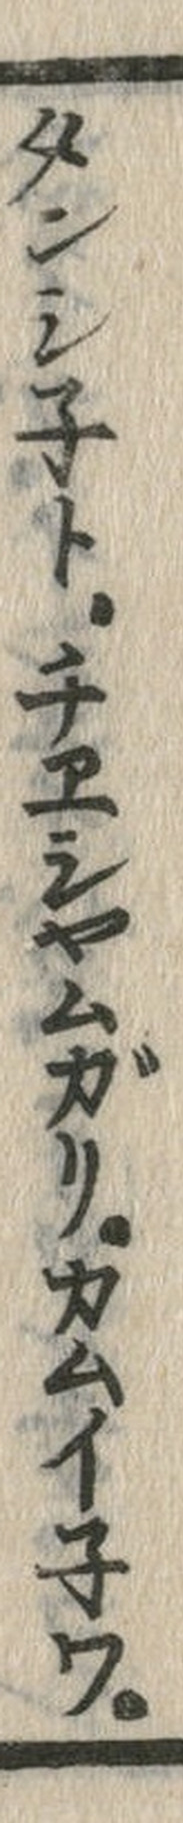タンシネト。チヱシヤムガリ。カムイネワ。
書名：蝦夷方言藻汐草　坤巻
